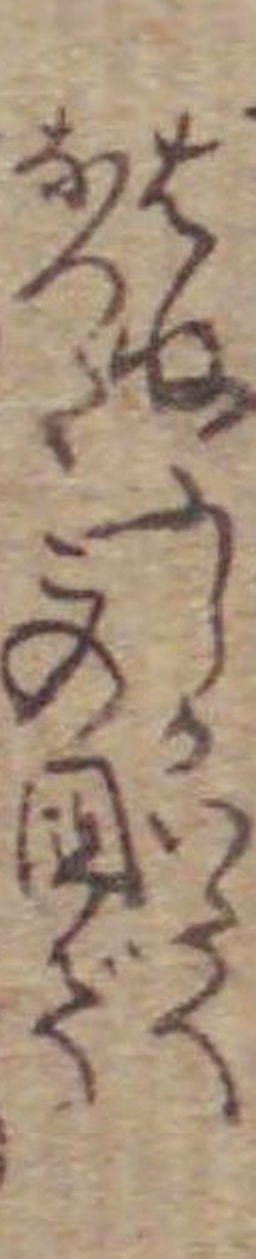なつたこの国で
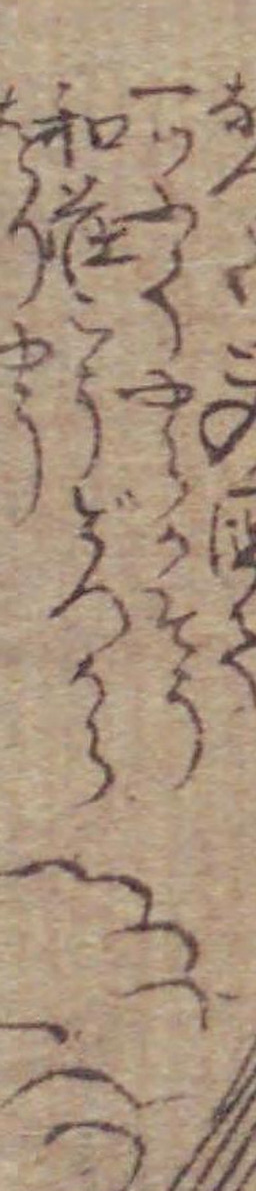和荘こうどつから

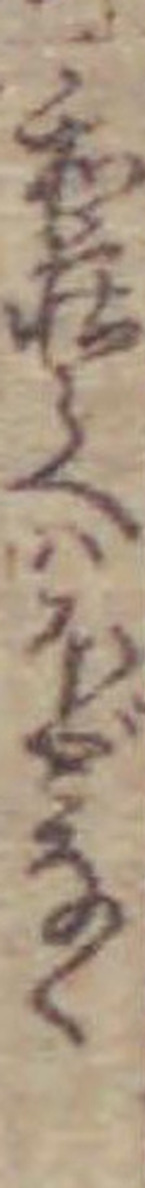和荘兵へはほどなく
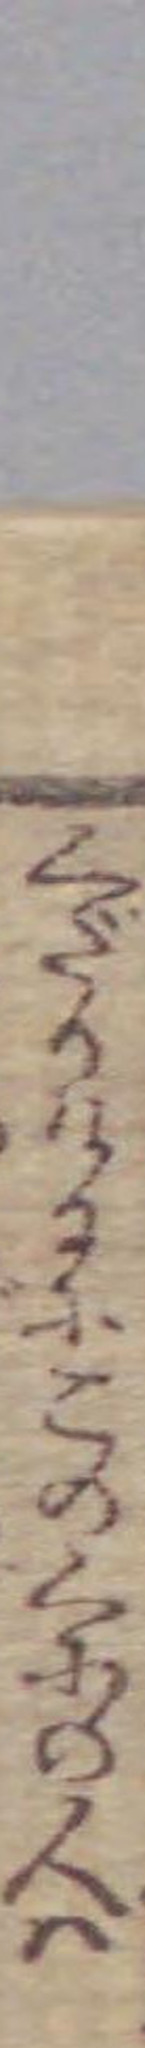くだりへるにこのくにの人は
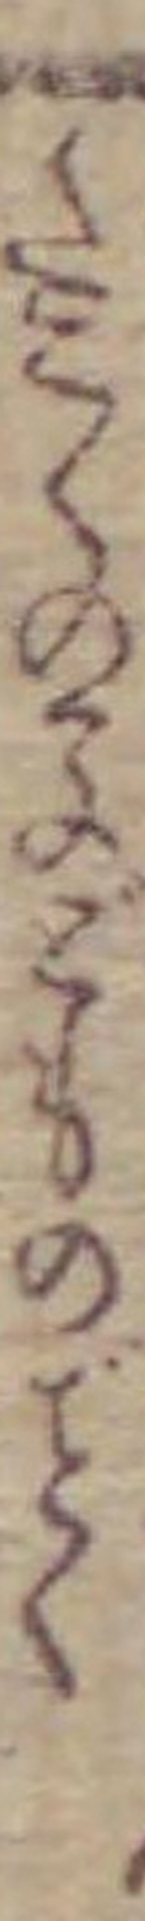たこくの子どものごとく
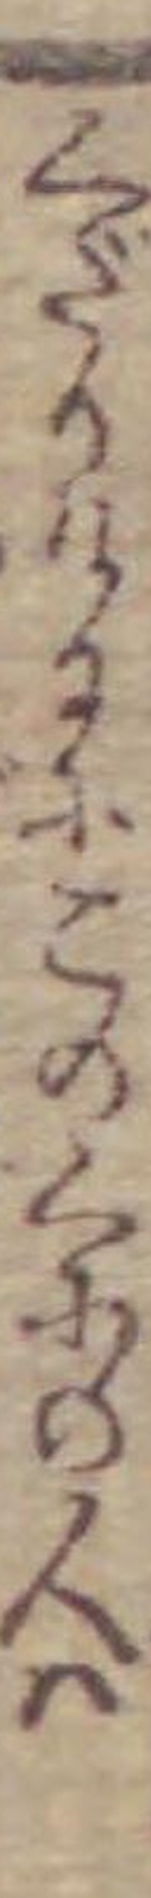くだりへるにこのくにの人は
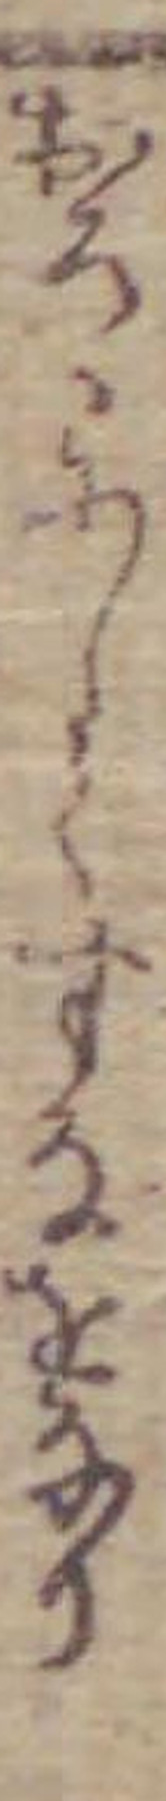おろかにしてすなをなり
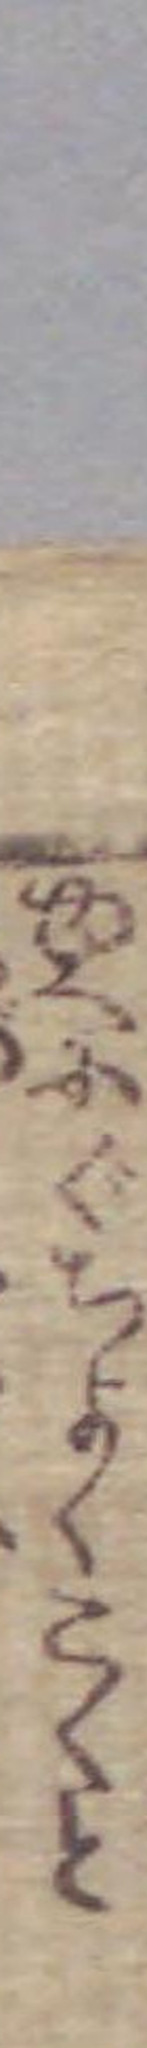ゆへにぐちよくこくと
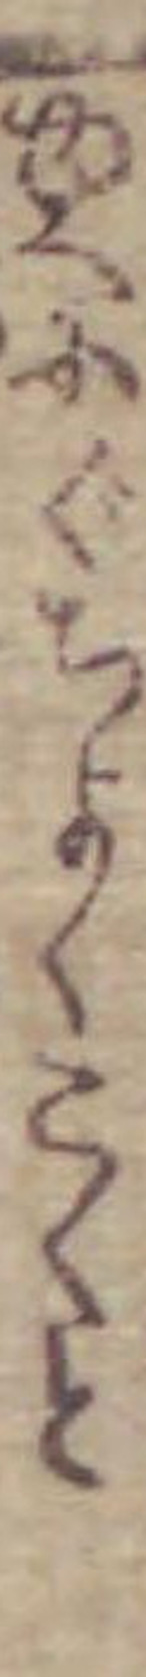ゆへにぐちよくこくと
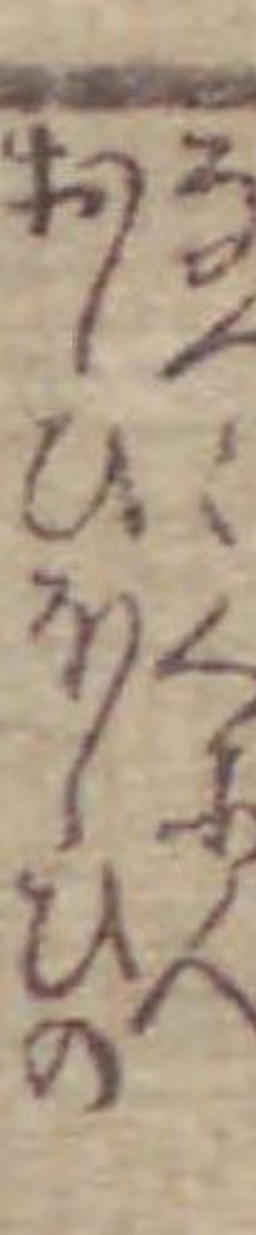おしひほしひの
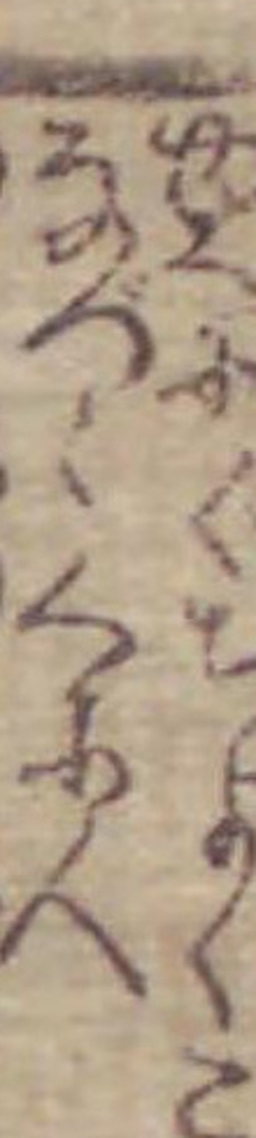なづくくに人
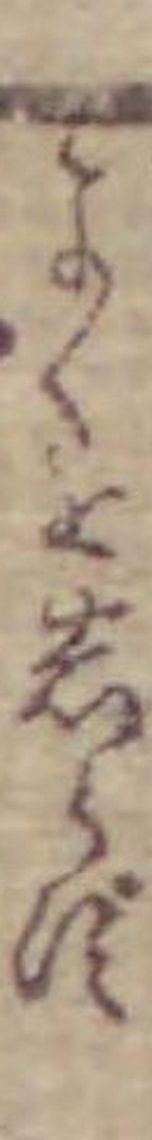よくをしらず
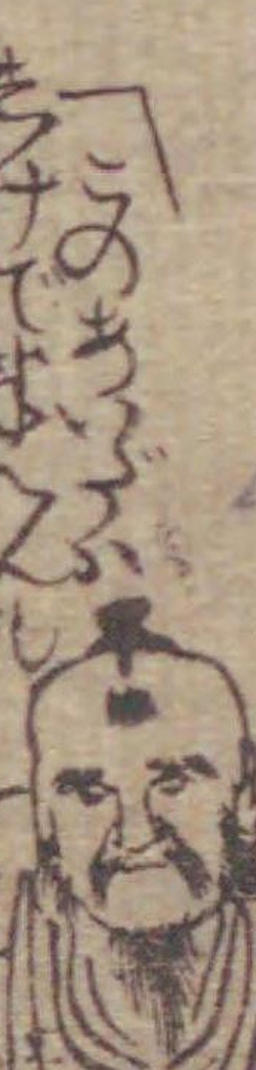〽このあいだは
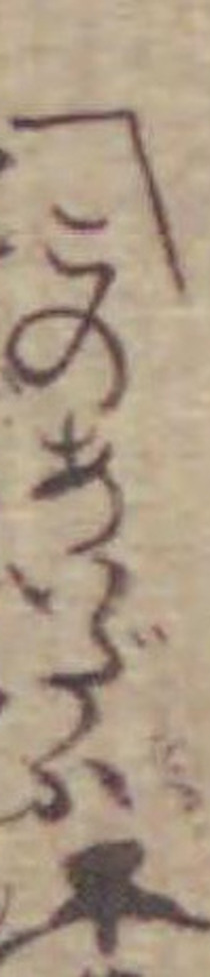〽このあいだは
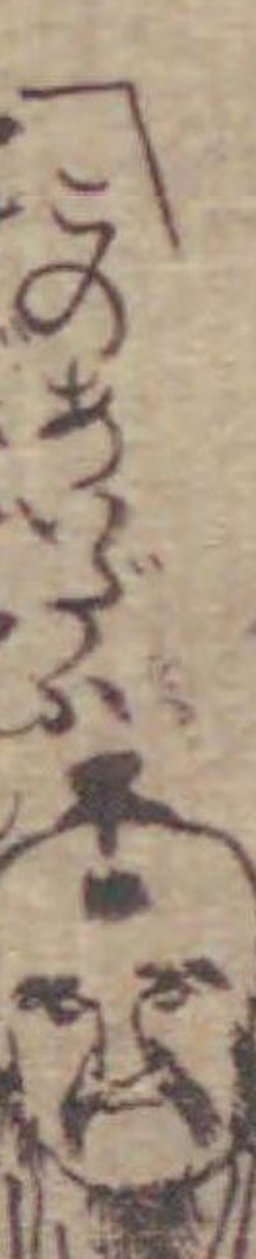〽このあいだは
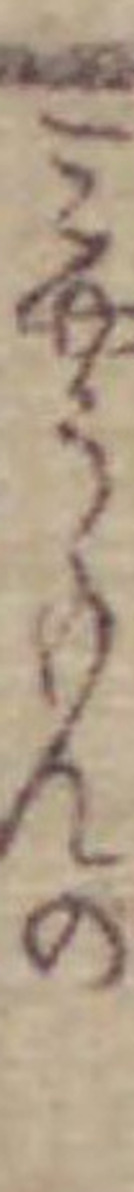みやうもんの
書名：和荘兵衛後日話 : 3巻
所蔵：国立国会図書館 National Diet Library, JAPAN
